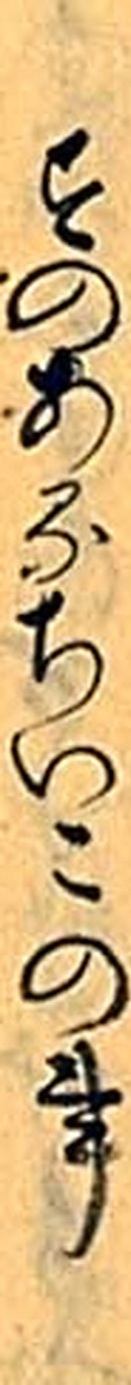すのあるちいこの事
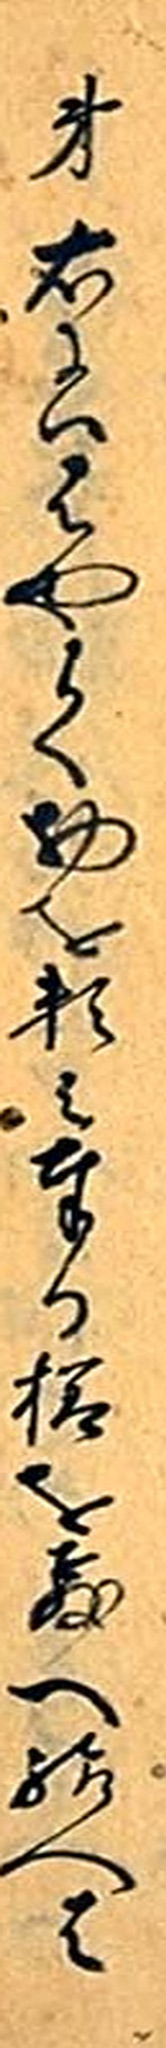弟右にははやよく物を頼み奉る様を教へ給へは
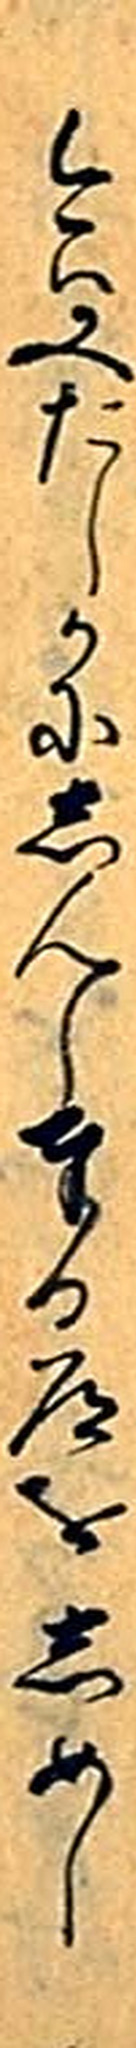今は又たしかにしんし奉る道をしめし
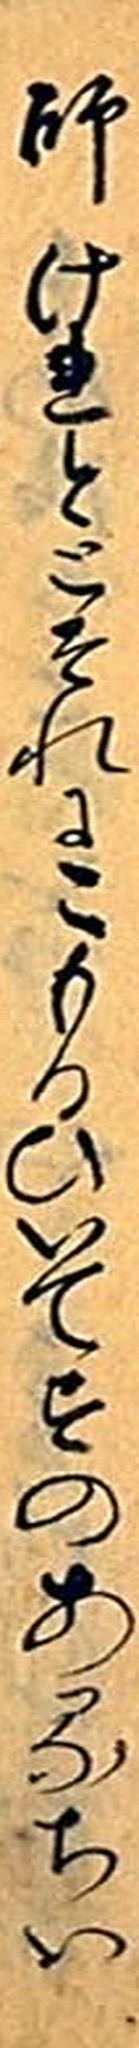師けれととそれにこもるひいてすのあるちい
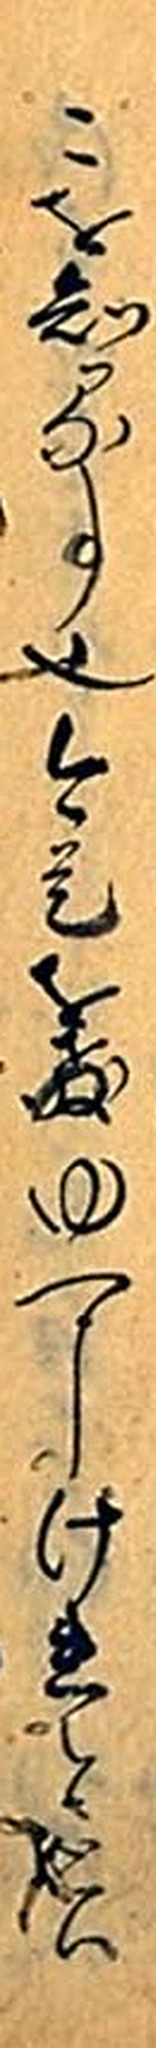こを知る事也今是を教ゆへしけれととは
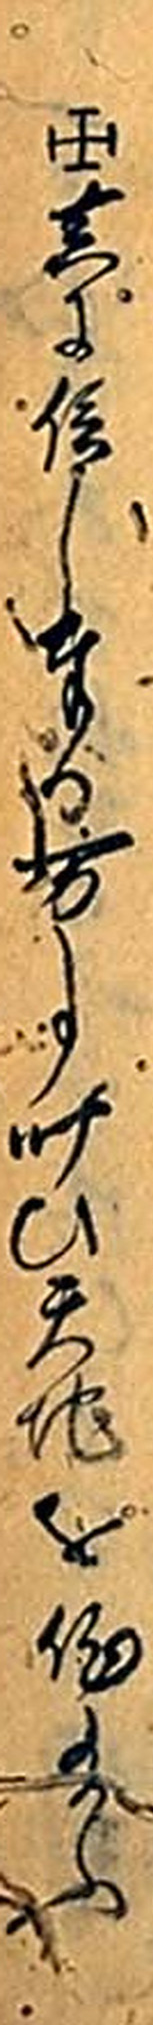☩真に信し奉る万事叶ひ天地を作給ふ

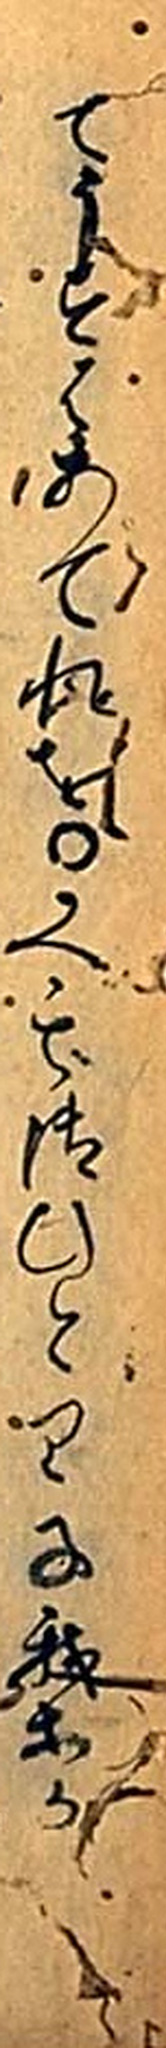てうすはあてれを○又其御ひとり子我等か
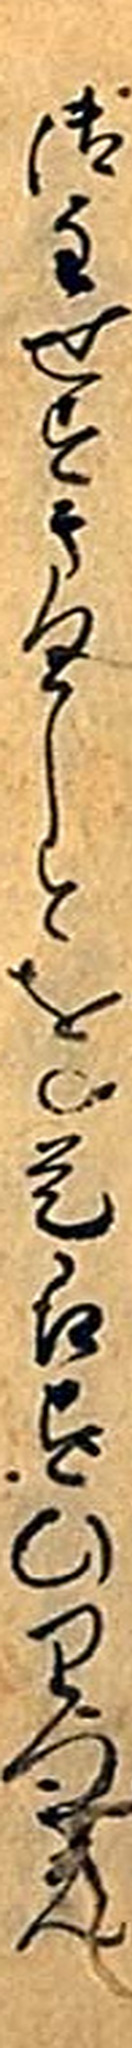御主せすきりしとを○是即すひりつん
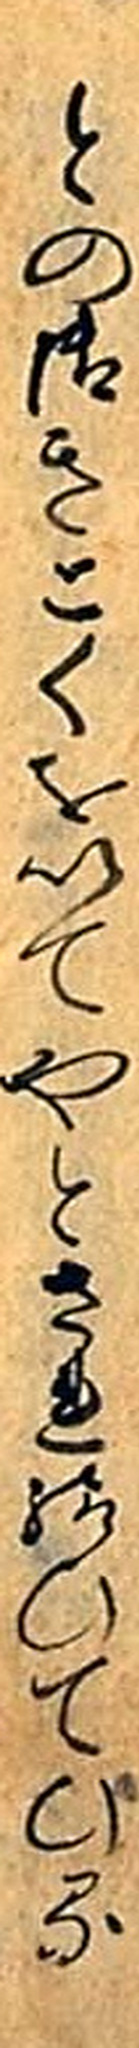との御きとくを以てやとされ給ひてひる
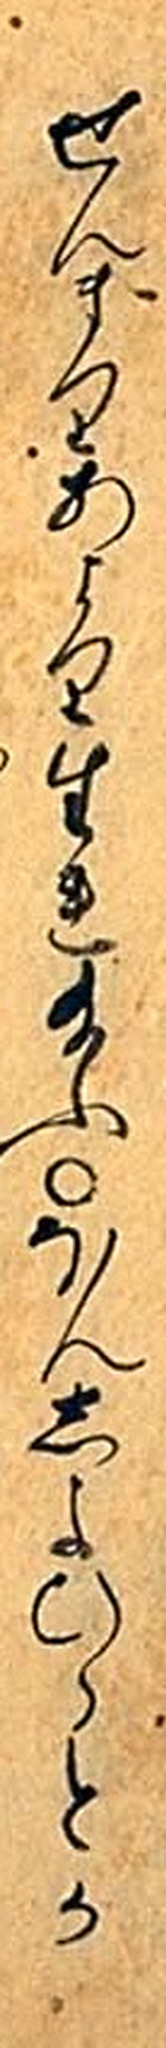せんまりあより生れ給ふ○ほんしよひらとか
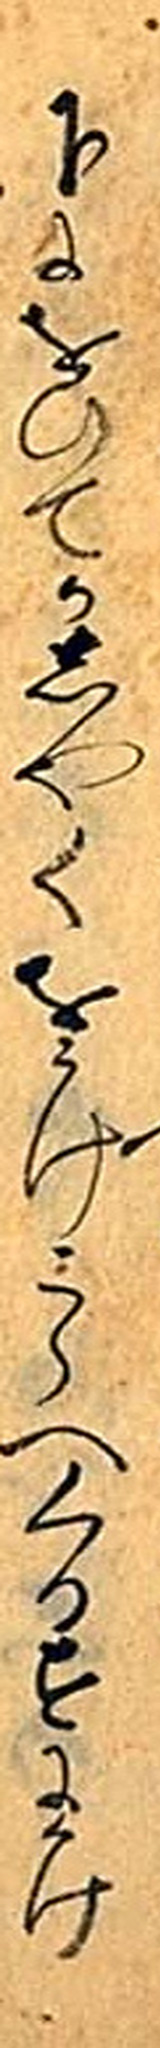下にをひてかしやくをうけこらへくるすにかけ
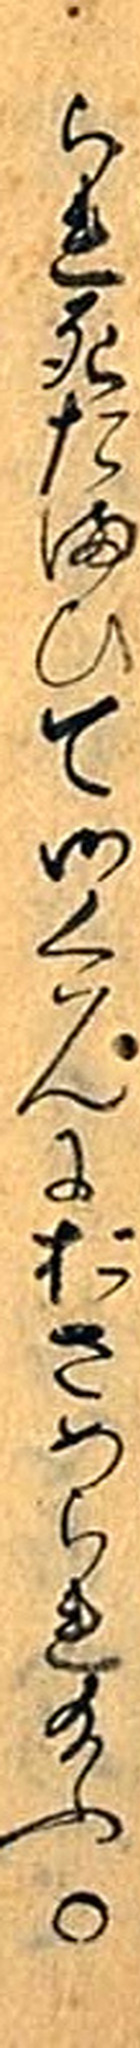られ死たまひて御くはんにおさめられ給ふ○
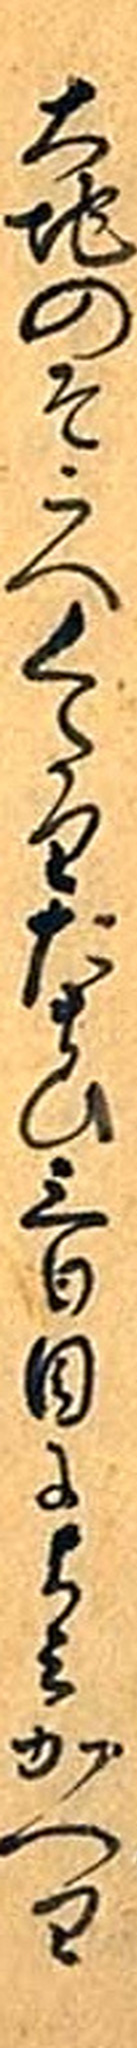大地のそこへくたりたまひ三日目によみかへり
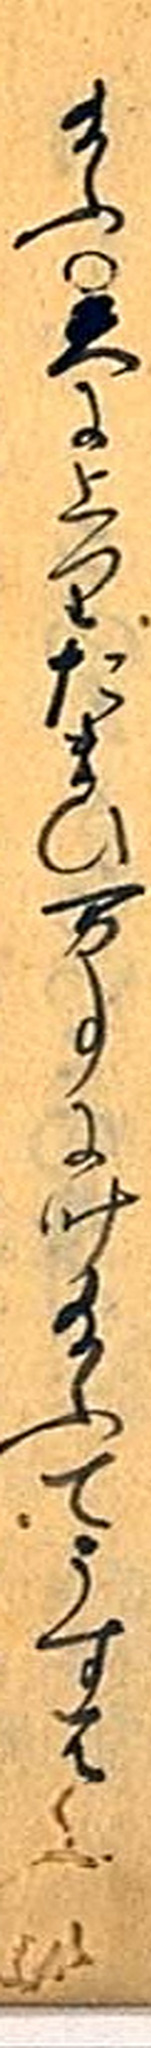給ふ○天に上りたまひ万事に叶給ふてうすは
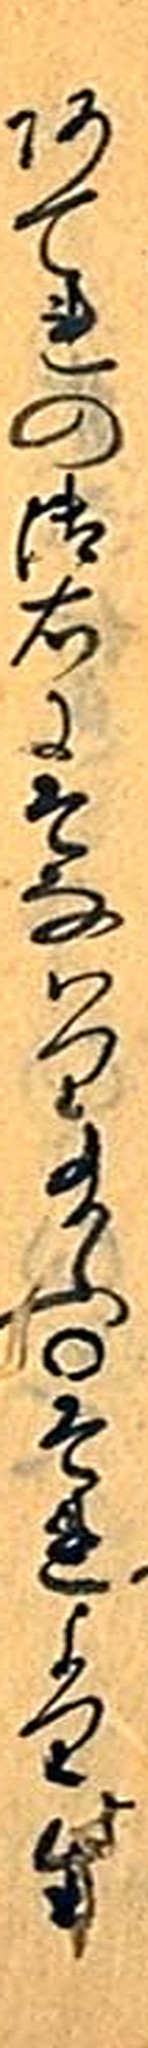あてれの御右にそなはり給ふ○それより生
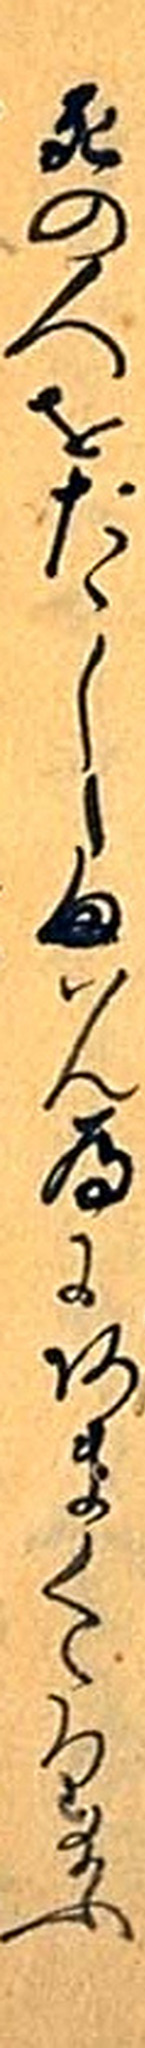死の人をたゝしたまはん為にあまくたり給ふ
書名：ドチリナ・キリシタン
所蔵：東京大学総合図書館 / General Library in the University of Tokyo
